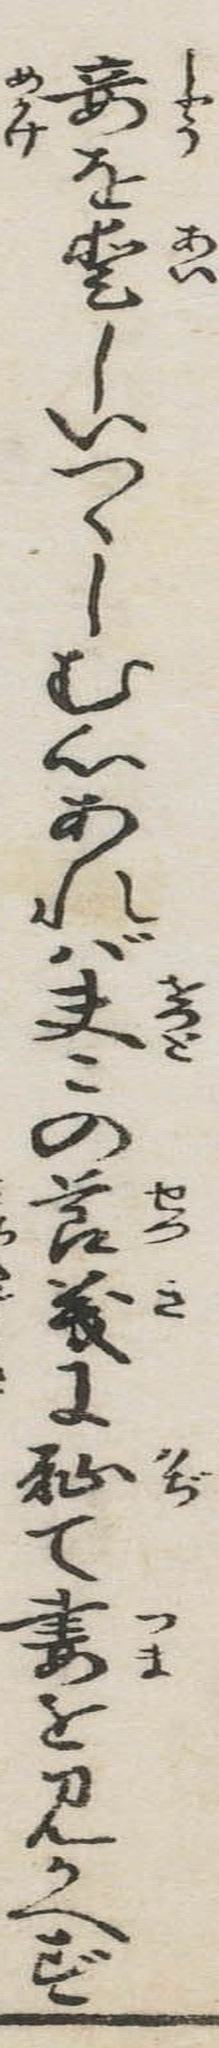妾を愛しいつくしむ心あれば夫この節義に恥て妻を見かへず
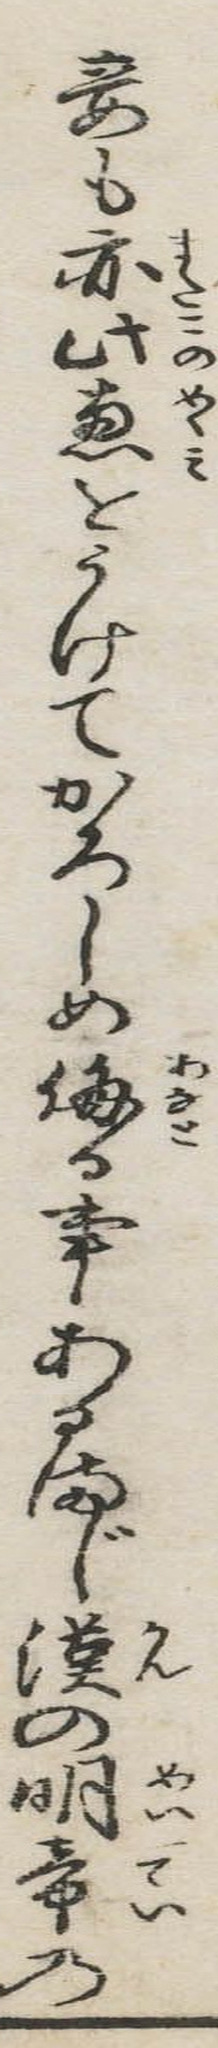妾も亦此恵をうけてかろしめ侮る事あるまじ漢の明帝の
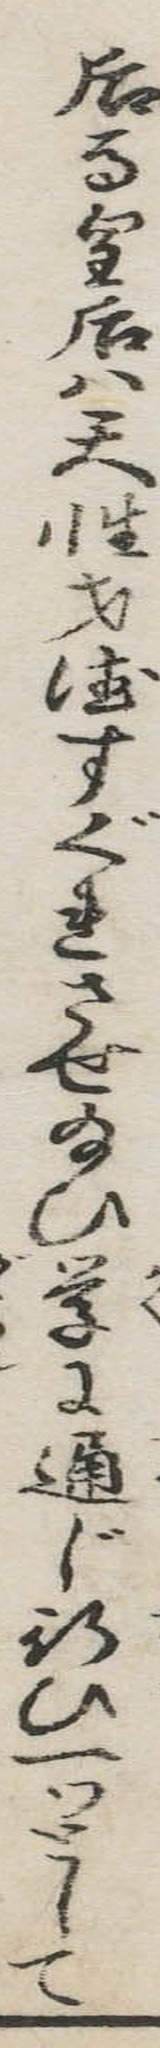后馬皇后は天性才徳すぐれさせ給ひ学に通じ行ひ一つとして
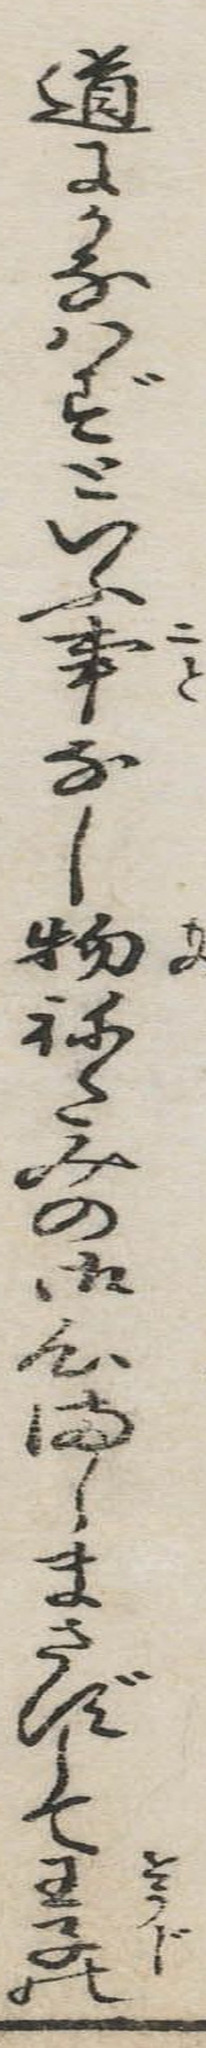道にかなはずといふ事なし物ねたみの御心ましまさずして王子の
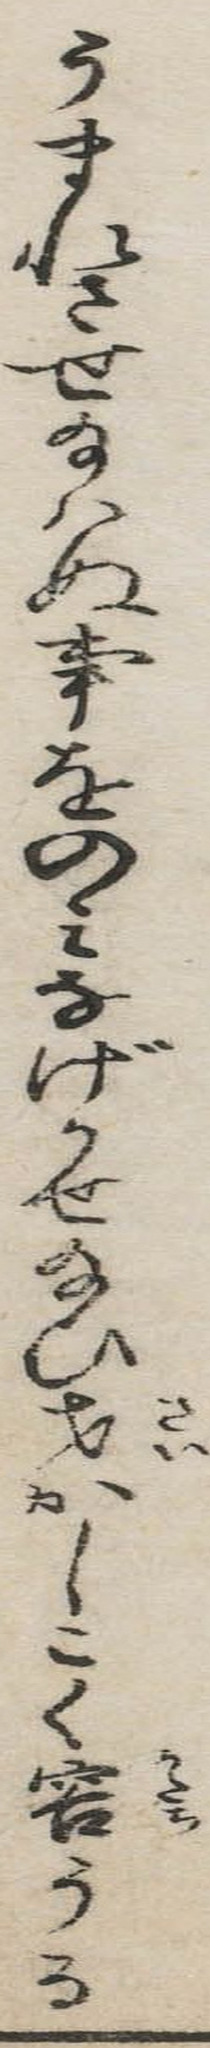うまれさせ給はぬ事をのみなげかせ給ひ才かしこく容うる
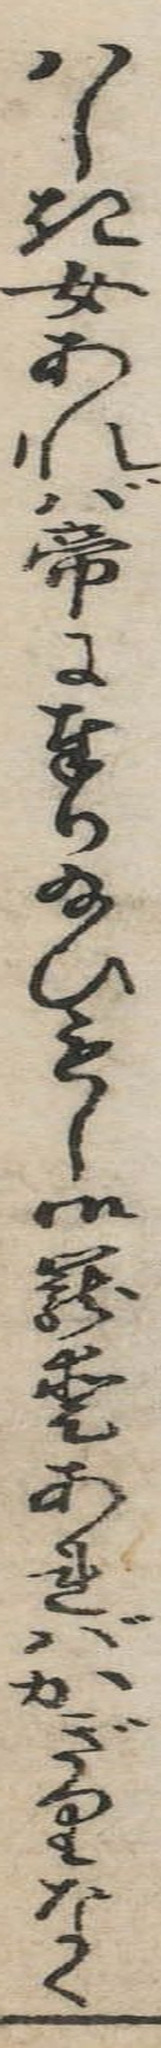はしき女あれば帝に奉り給ひもし御寵愛あればかぎりなく

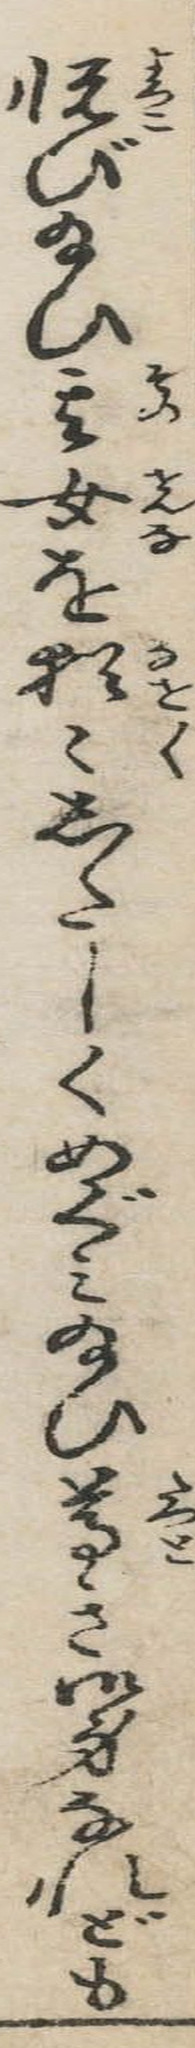悦び給ひ其女を猶々したしくめぐみ給ひ尊き御身なれども
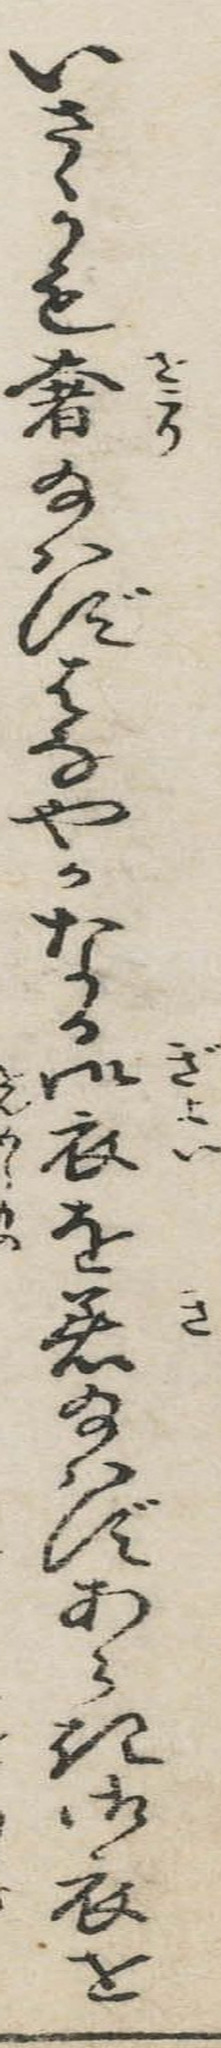いさゝかも奢給はずはなやかなる御衣を着給はずあらき御衣を
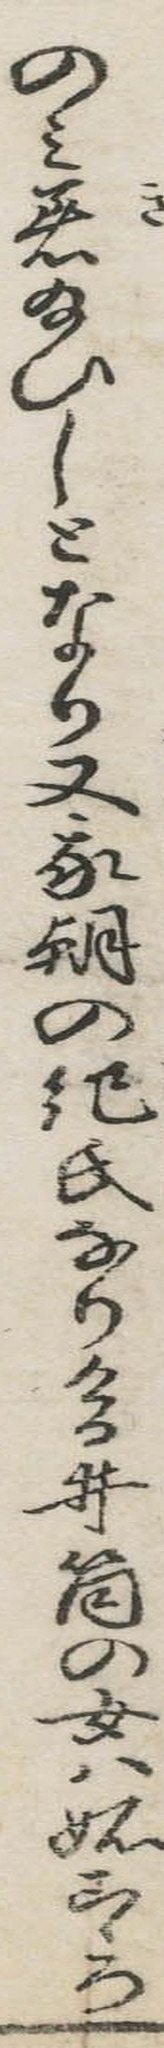のみ着給ひしとなり又我朝の紀氏なりける井筒の女は妬こゝろ
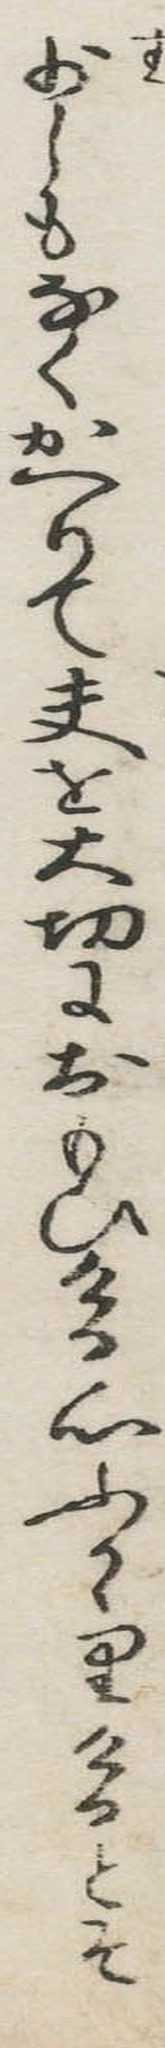少しもなくかへりて夫を大切におもひける心ふかゝりけるとそ
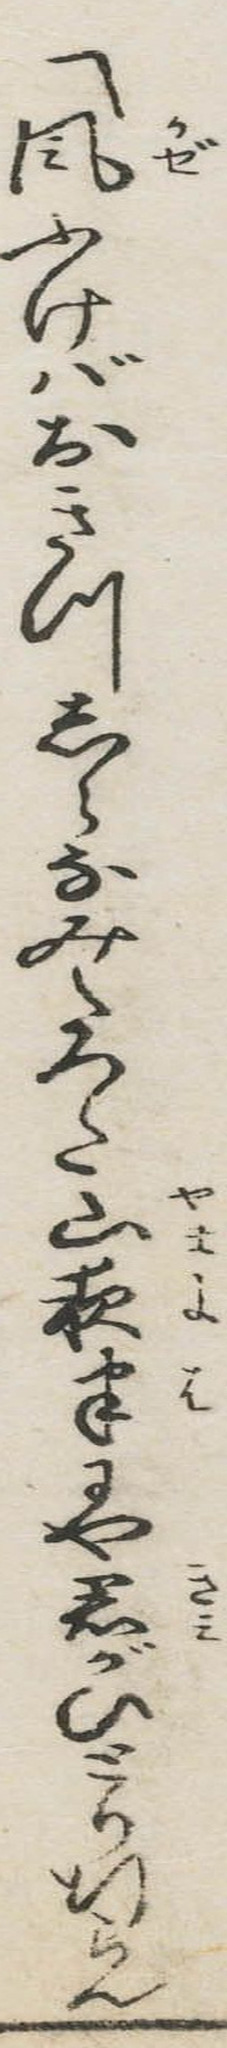「風ふけばおきつしらなみたつた山夜半にや君がひとり行らん
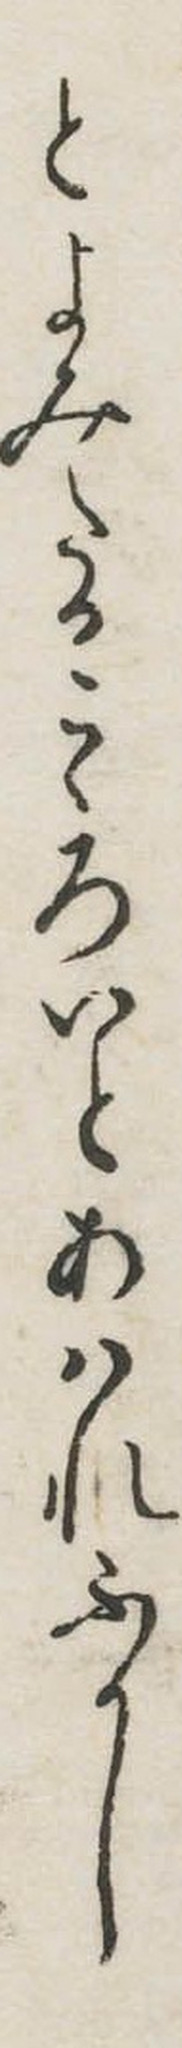とよみたるこゝろいとあはれふかし
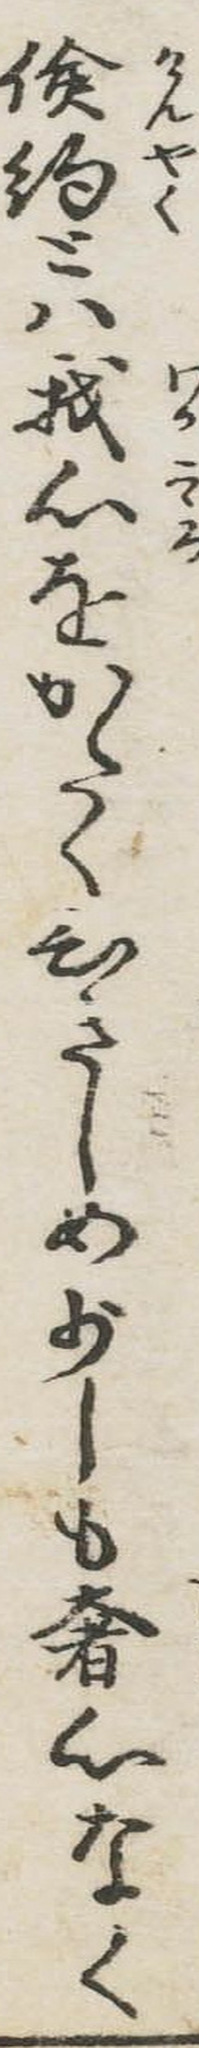倹約倹約とは我心をかたくひきしめ少しも奢心なく
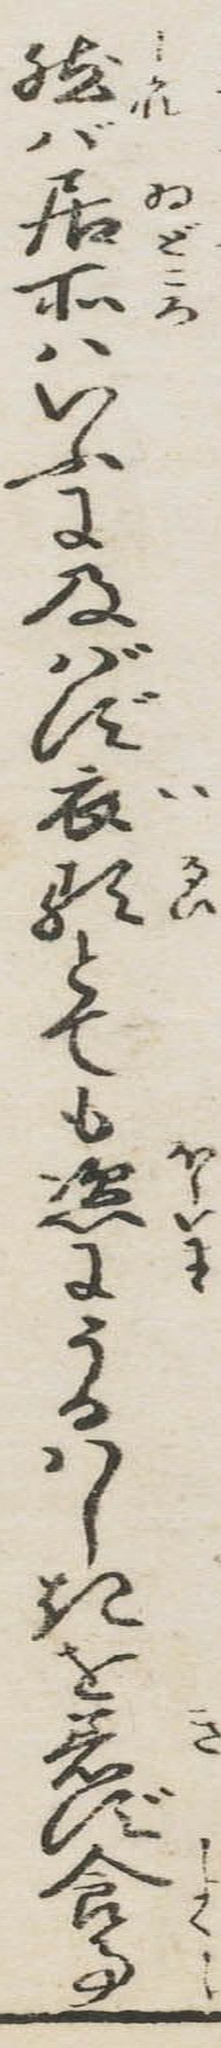然ば居所はいふに及ばず衣類とても恣にうるはしきを着ず食事
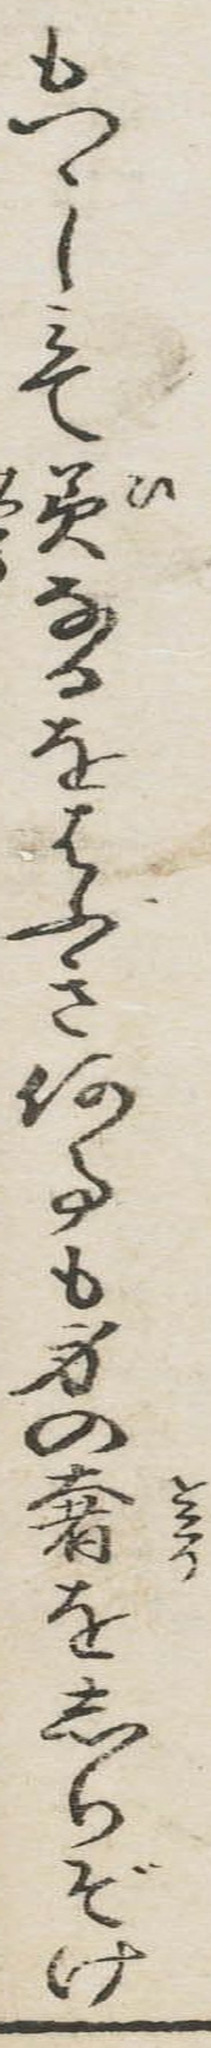もつゝしみて美なるをはふき何事も身の奢をしりぞけ
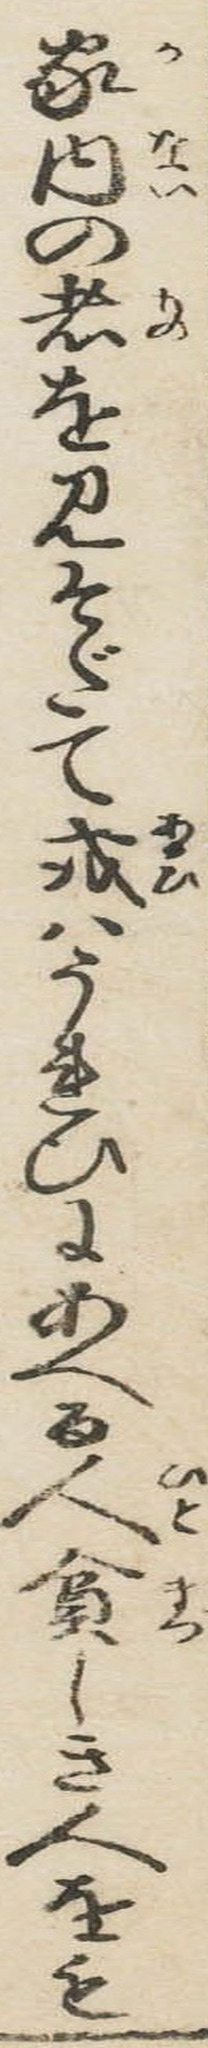家内の者を見そだて或はうれひにあへる人貧しき人をも
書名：前訓
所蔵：東京学芸大学附属図書館
